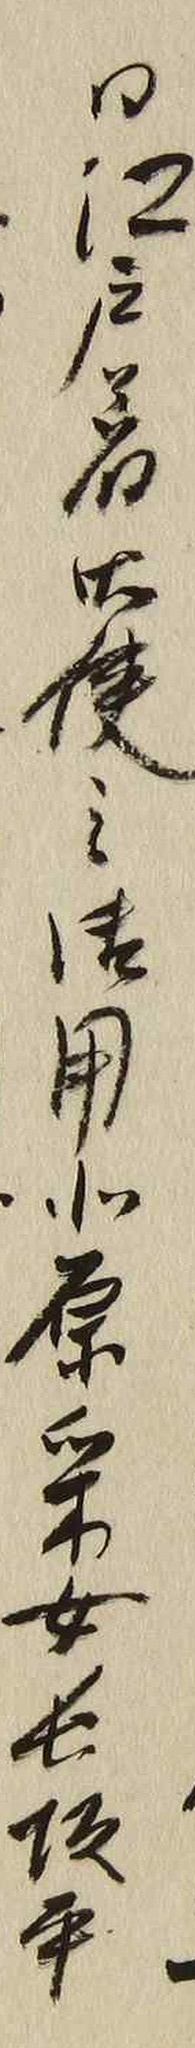日江戸着御使之御用北原采女長坂平
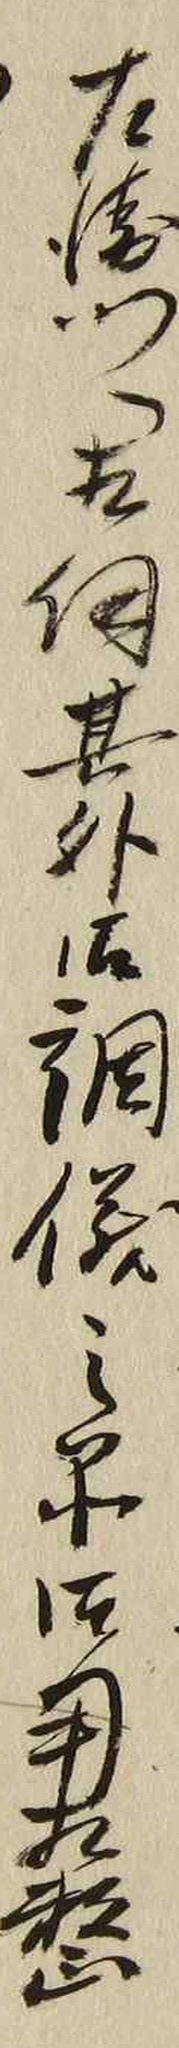左衛門へ相伺其外御調儀之品御用相整
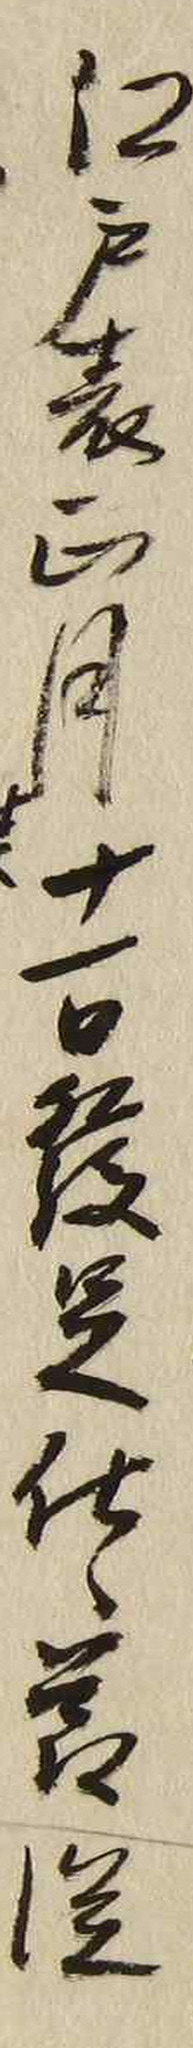江戸表正月十一日発足仕候節従
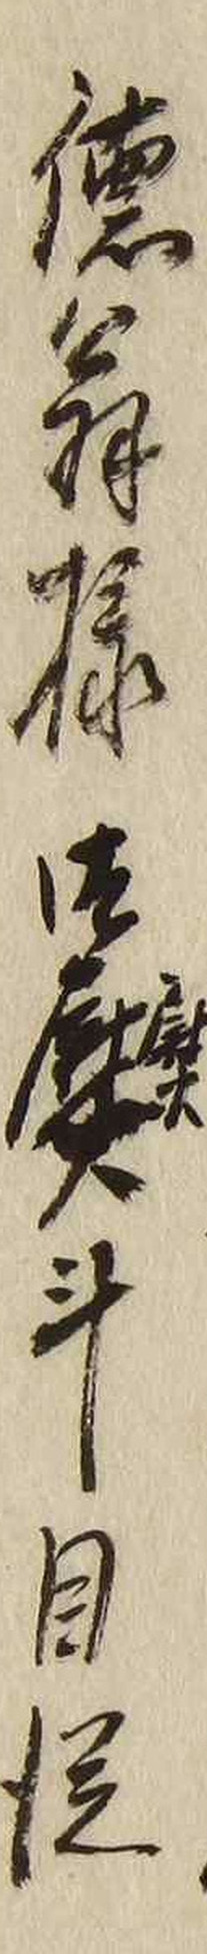徳翁様御熨斗目従

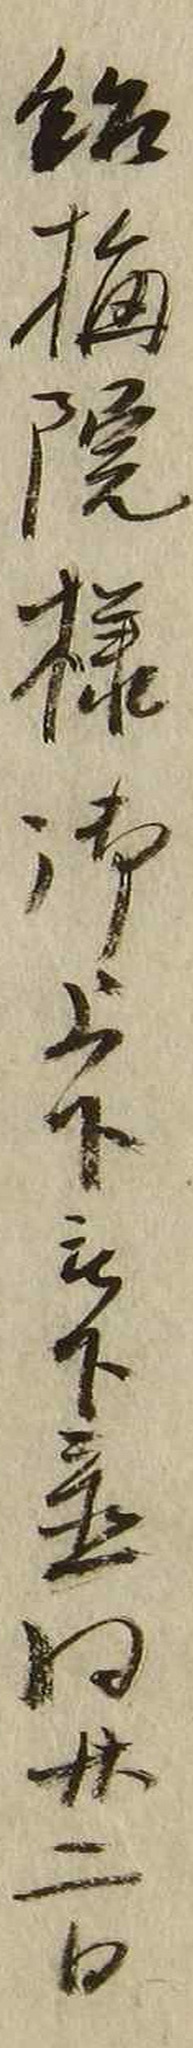紹栴院様御上下被下置同廿二日
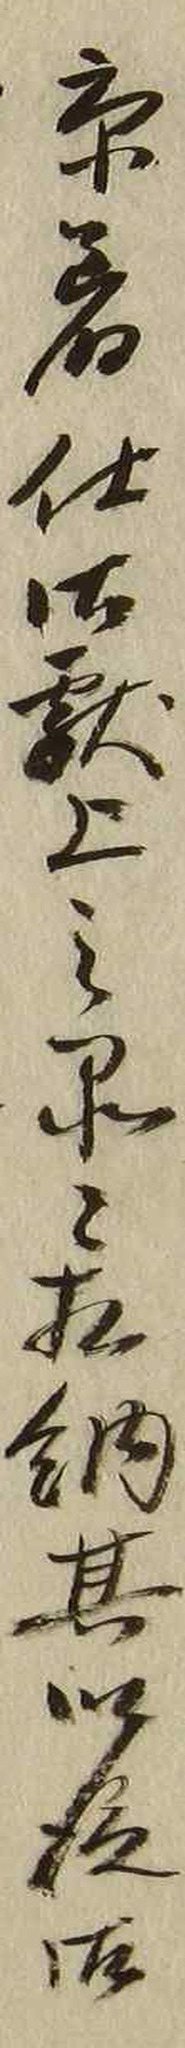京着仕御献上之品々相納其以後御
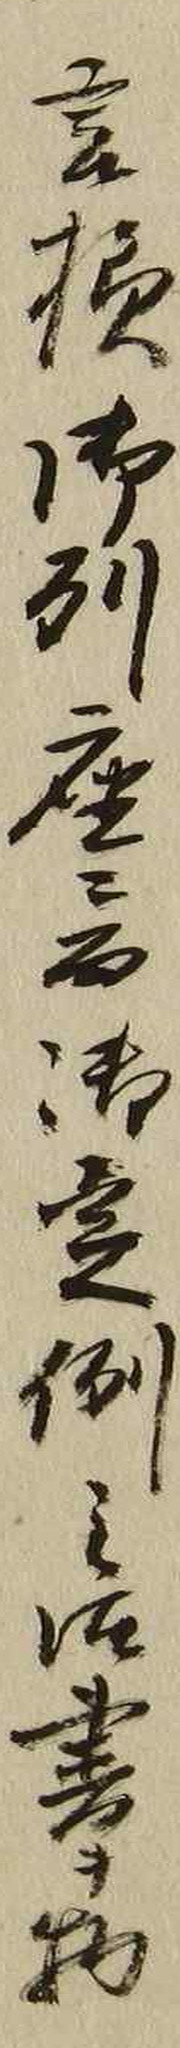言様御列座ニ而御定例之御書キ物
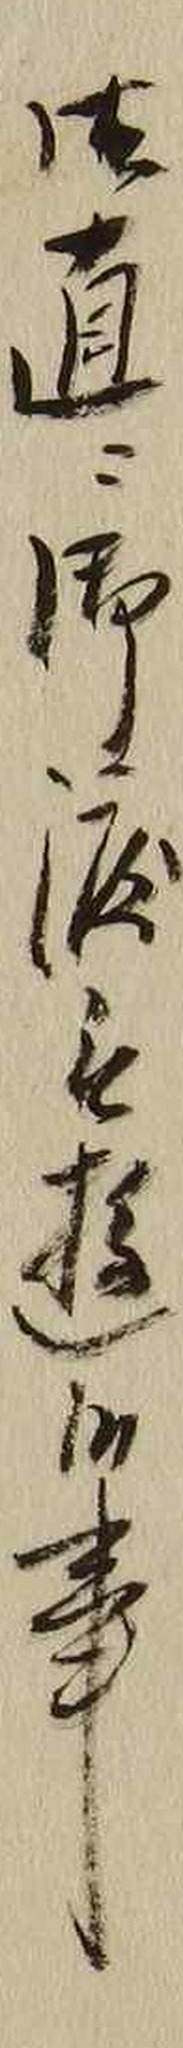御直ニ御渡被遊候事
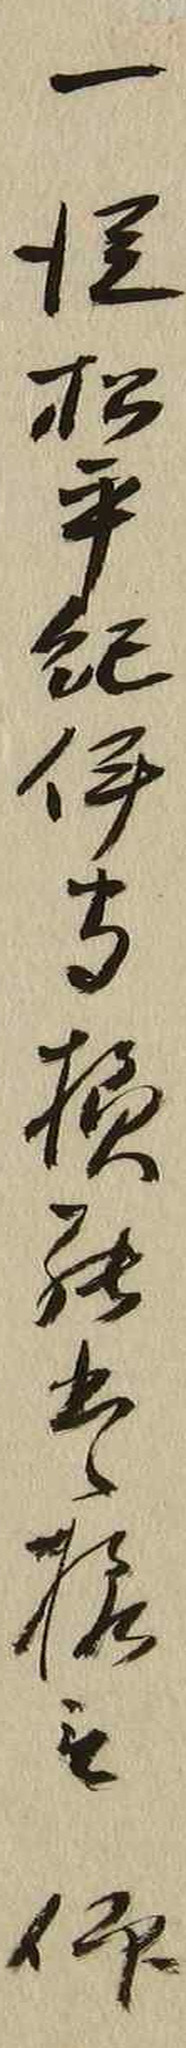一従松平紀伊守様罷出候様被仰
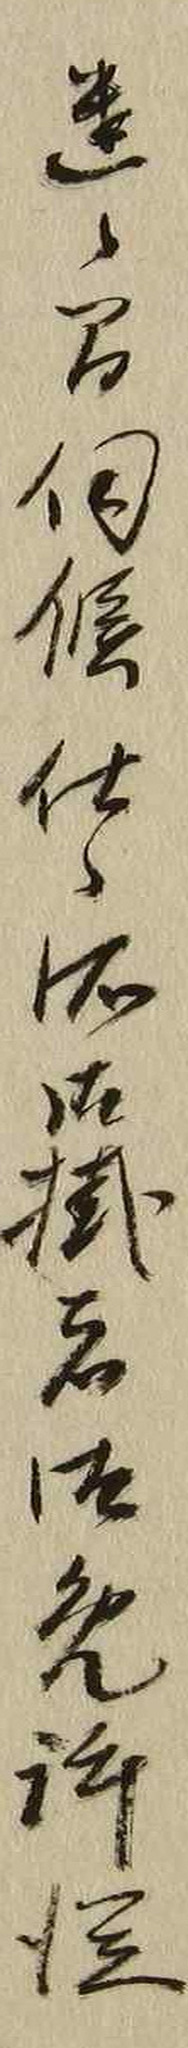遣候間伺候仕候所御掛者御免許従
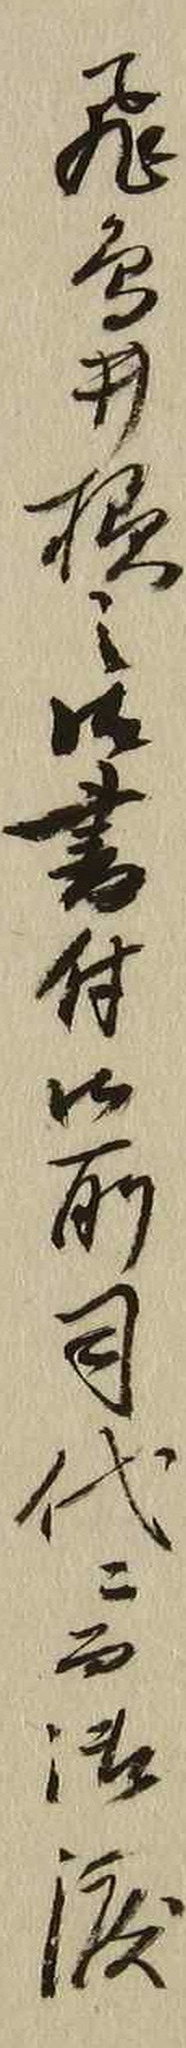飛鳥井様之御書付御所司代ニ而御渡
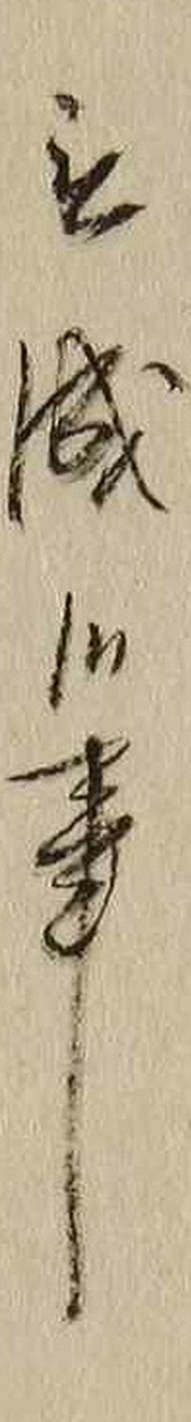被成候事
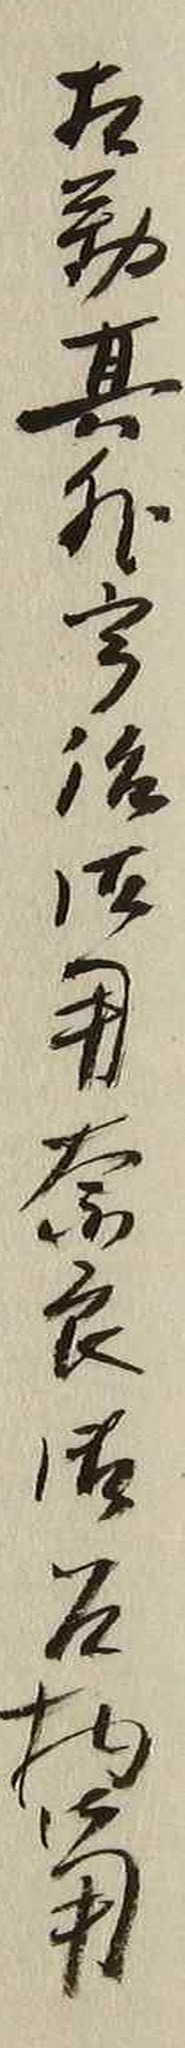相勤其外宇治御用奈良御召物御用
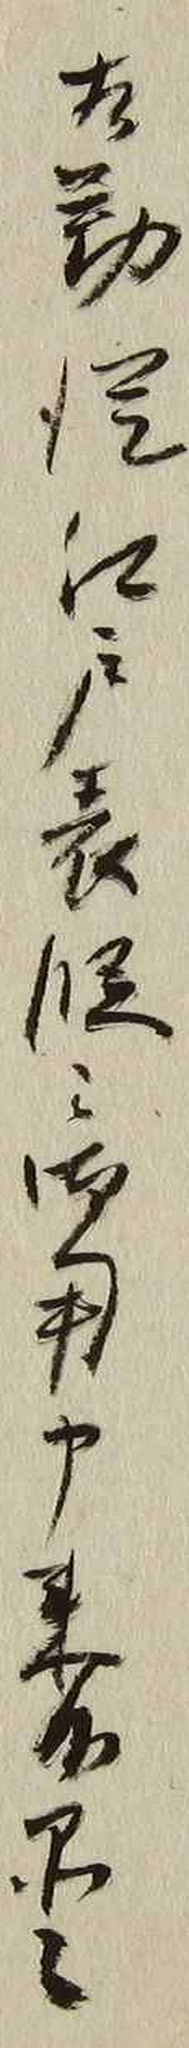相勤従江戸表段々御用申来候品々
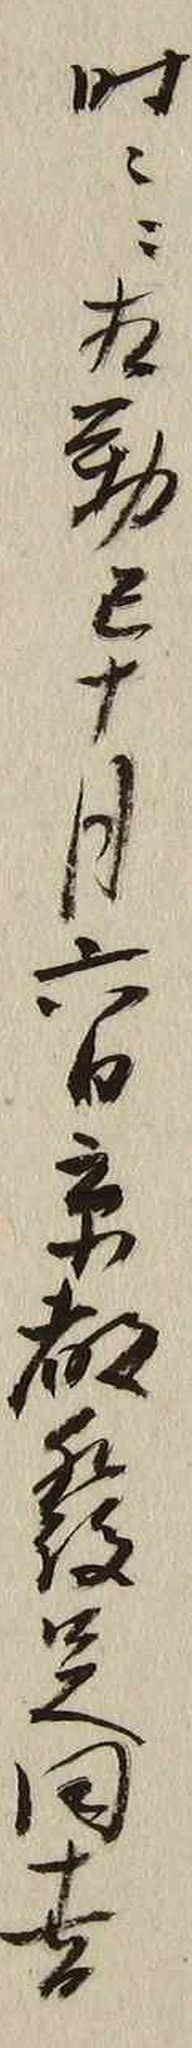時々ニ相勤巳十月六日京都発足同十七日
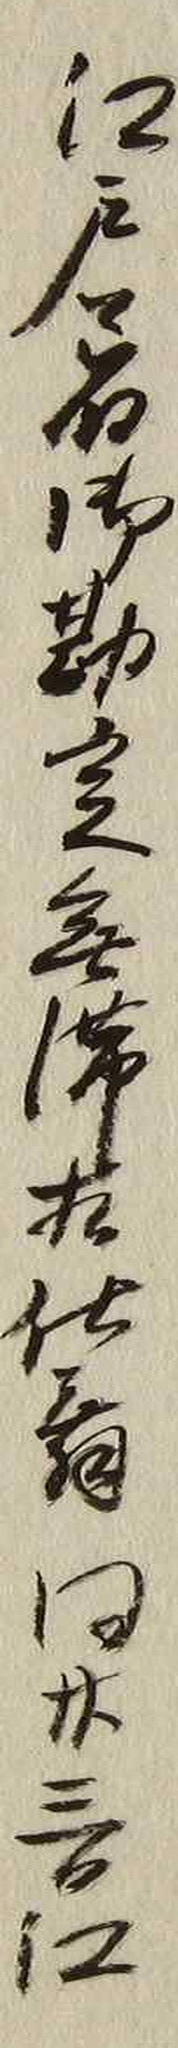江戸着御勘定無滞相仕舞同廿三日江
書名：諸士系譜　巻之346　も之部2
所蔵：会津若松市立会津図書館
